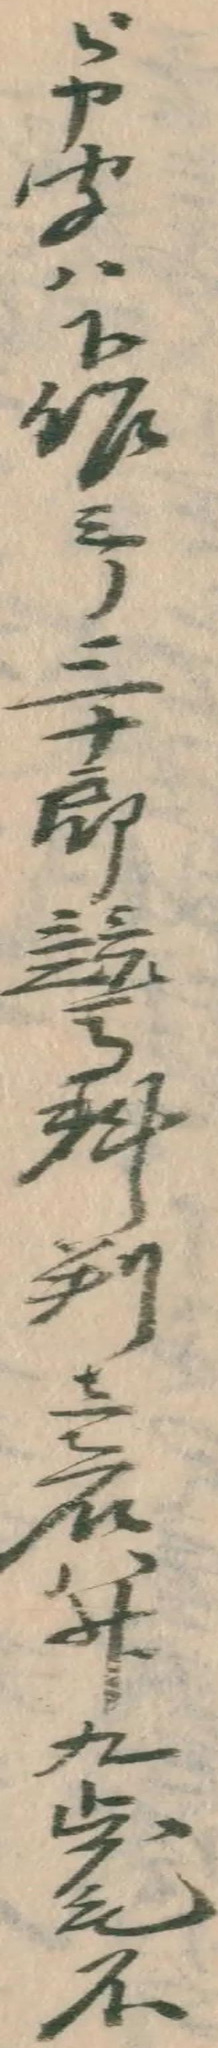被申聞ハ下作三ノ三十郎競馬料判壱石八升九歩毛不
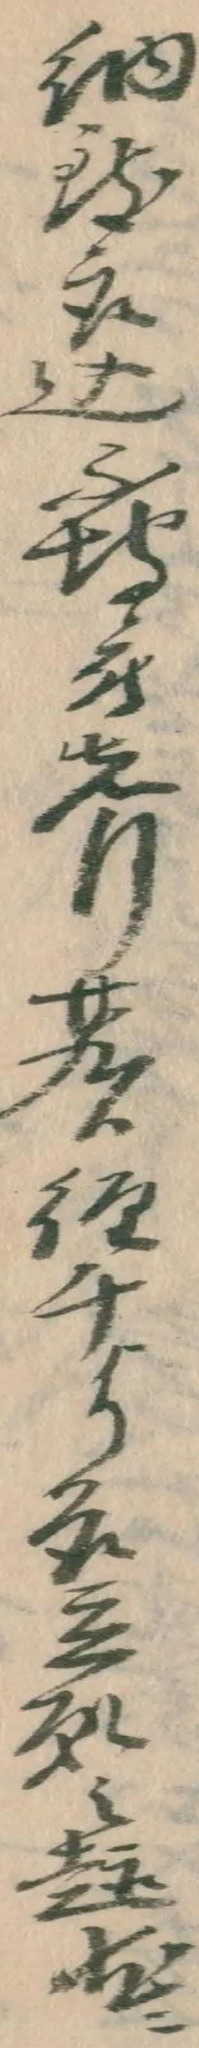納致取込不埒ニ付先月廿九日経千より取立願之趣尤ニ
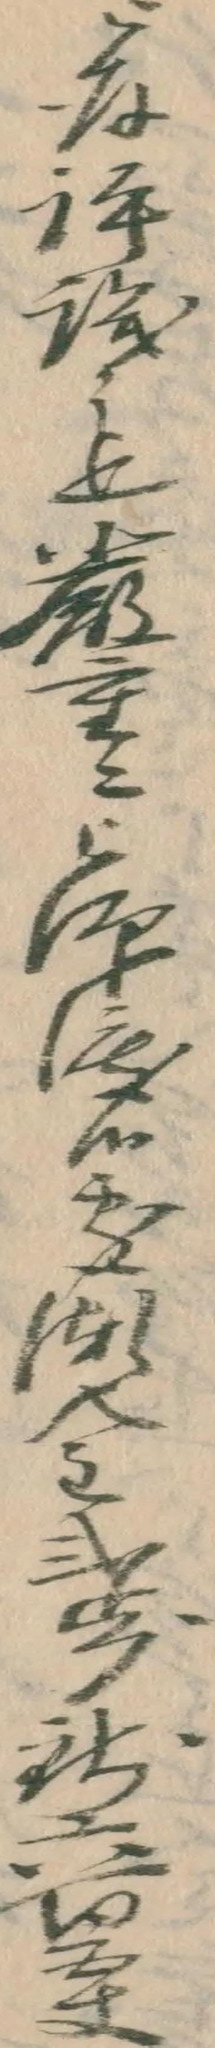被存評議之上厳重ニ被仰渡候處漸金弐歩銀六百五十匁
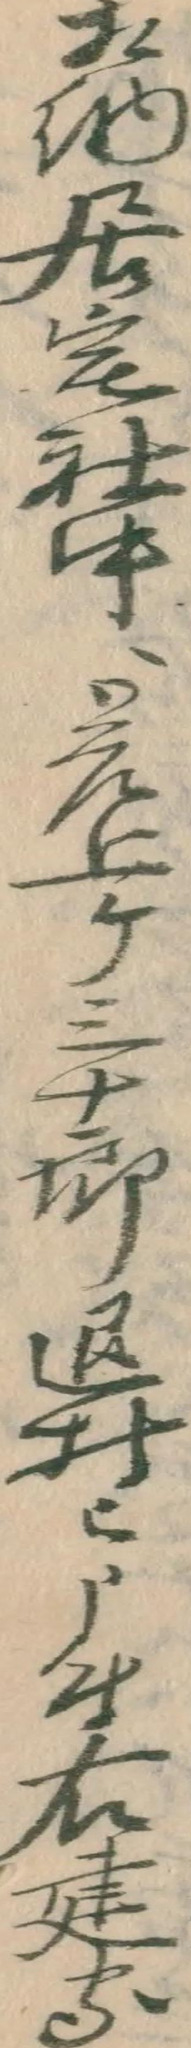相納居宅社中へ御差上ケ三十郎退村被申付右建家
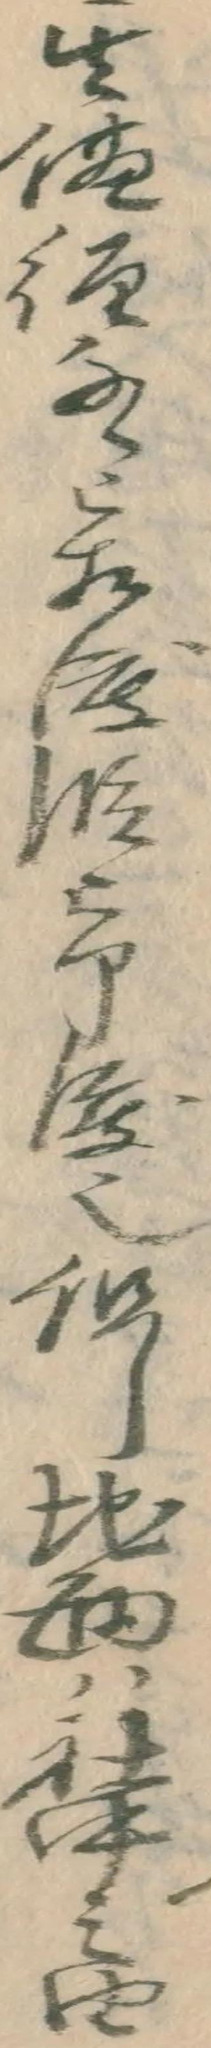其侭経千ヘ被相渡段被申渡也但し地面ハ社中之由
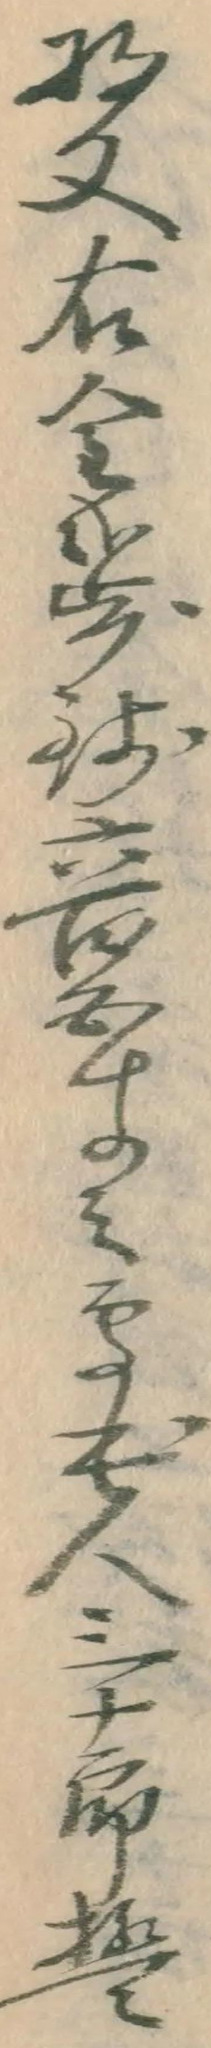持又右金弐歩銭六百五十の之處壱人三十郎惣

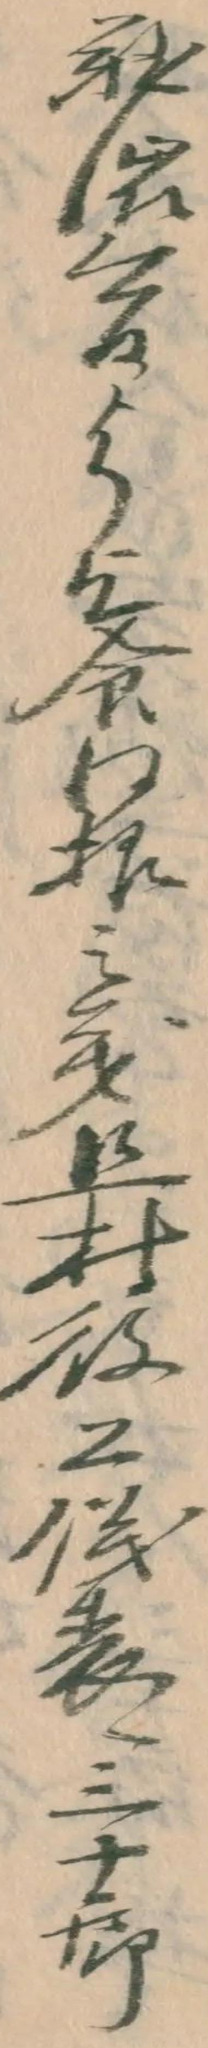難渋今日より乞食同様之義且村役公儀表へ三十郎
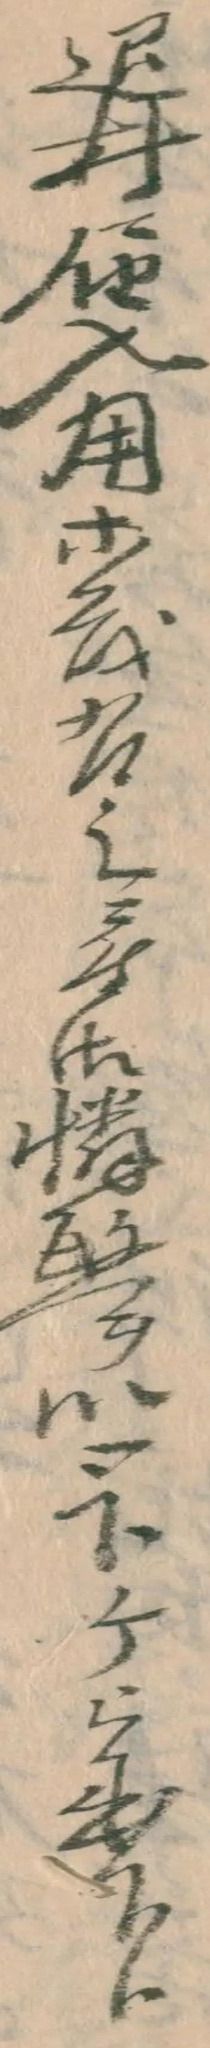退村届入用等も有之ニ付御憐愍ヲ以御下け被出下候
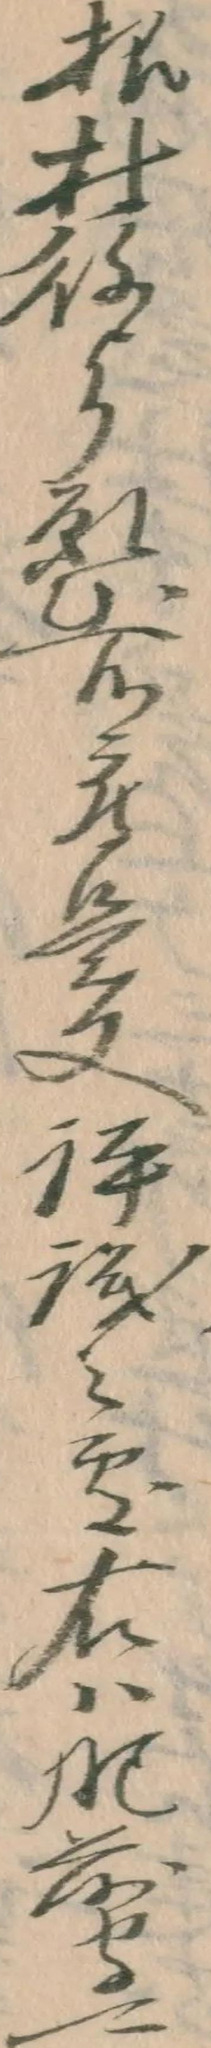様村役より願出候ニ付是又評議之處右ハ肥前守可
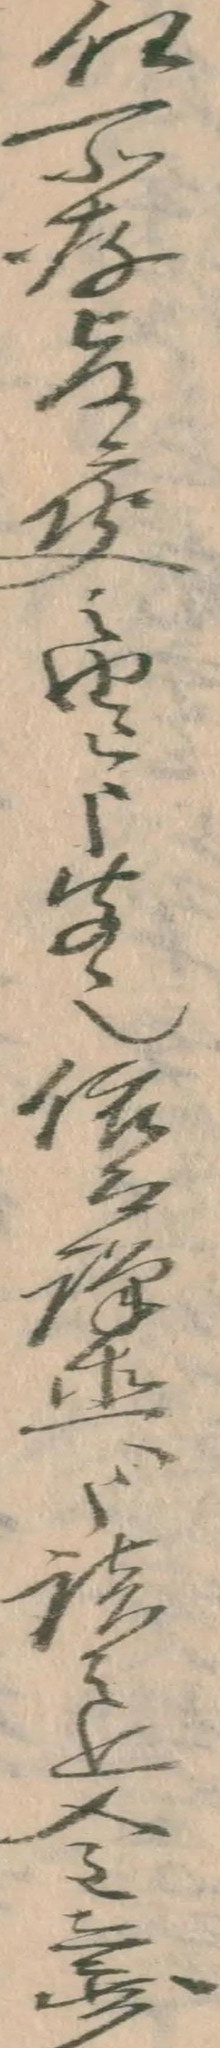任所存旨ニ決之由被申聞也依而謹直へ申談之上金壱歩
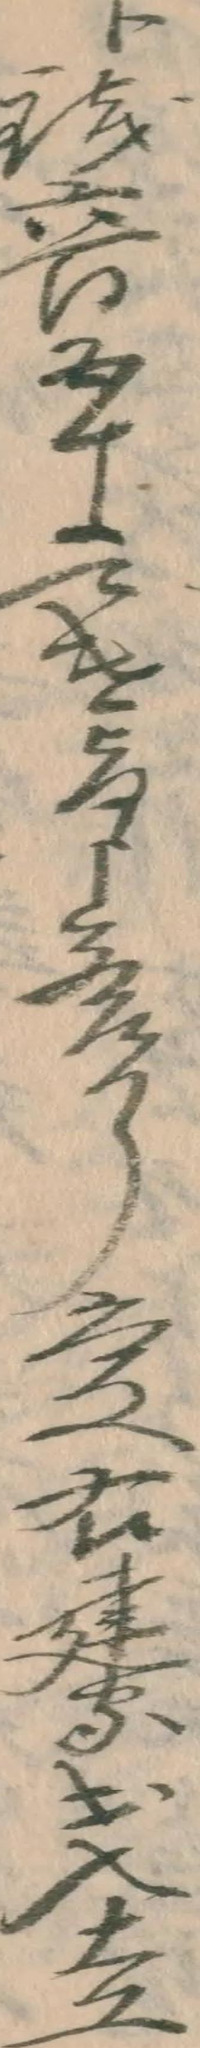ト銭六百五十匁可遣旨申答了尚亦右建家出入大工
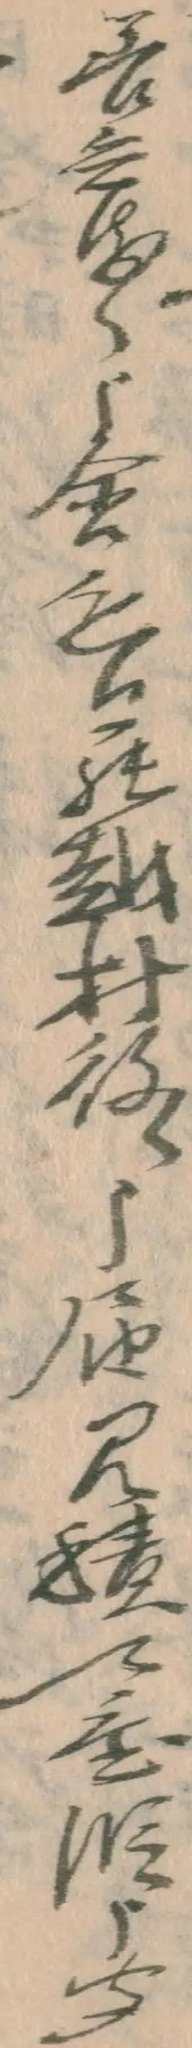善兵衛へ申會近日罷越村役ヘ申届見積可置段申聞
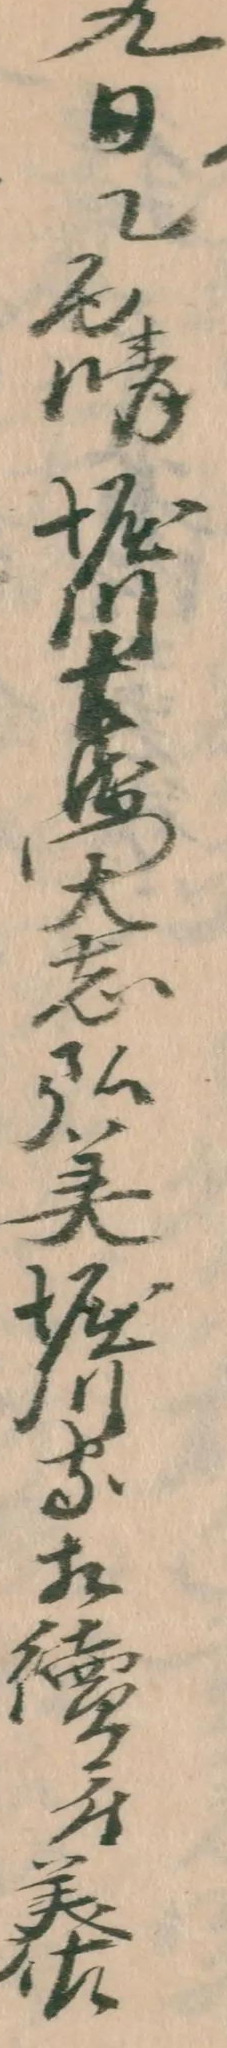九日乙酉晴堀川左衛門大志弘美堀川守相續ニ付美佐
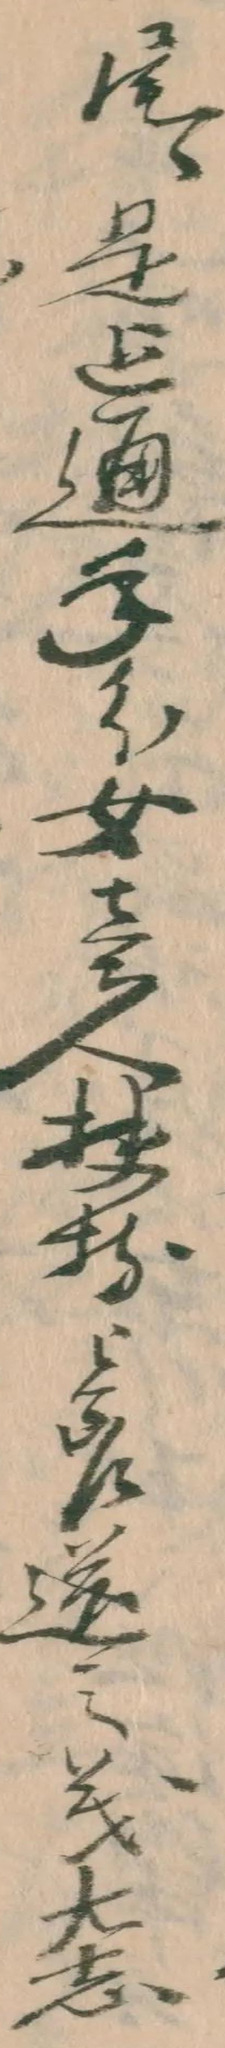尾へ是迄通手分女壱人扶持被差送之義大志
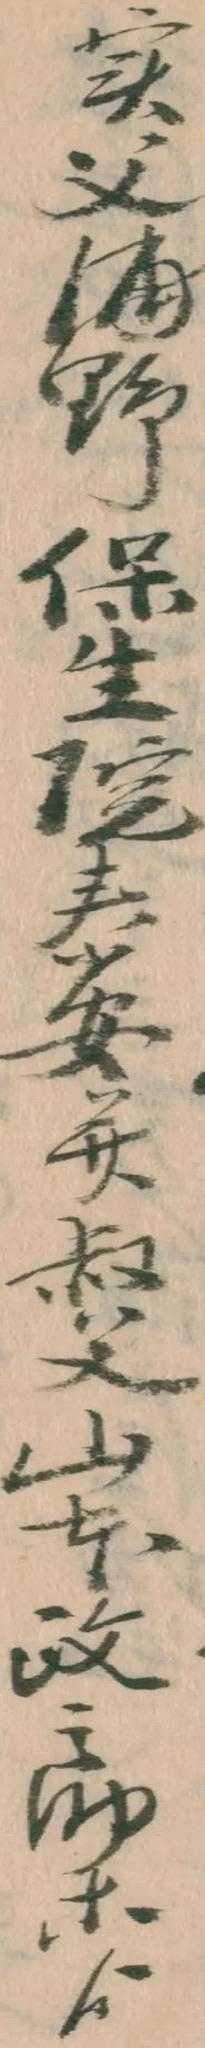実父浦野保生院泰安幷叔父山本政之助等ゟ
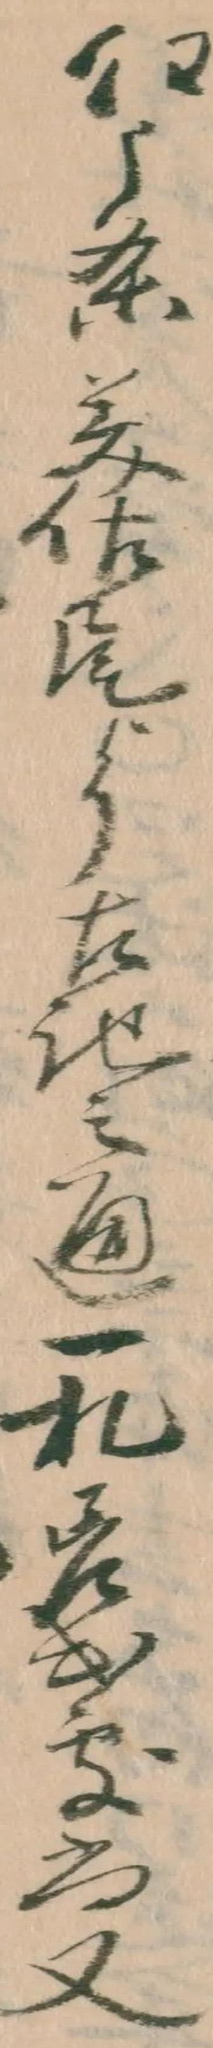任申条美佐尾より左記之通一札差出處尚又
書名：賀茂社記録. 第67冊
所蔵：国立国会図書館 National Diet Library, JAPAN
